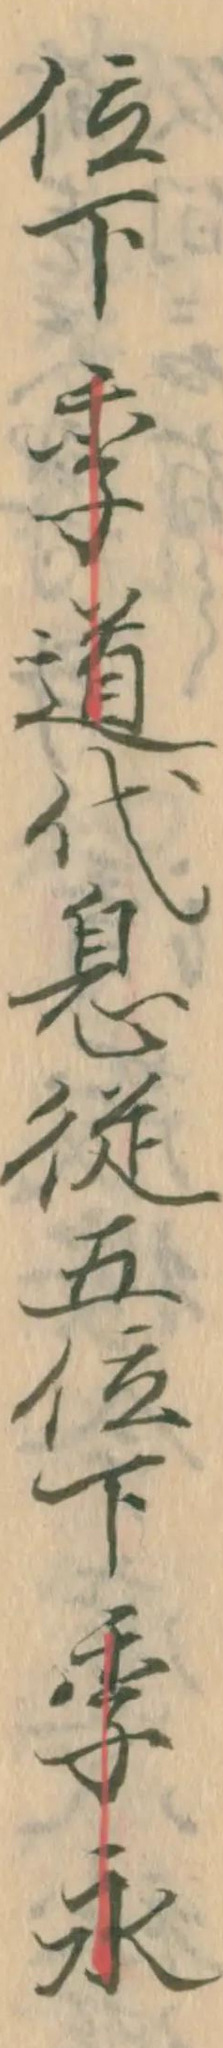位下李道代息従五位下季永
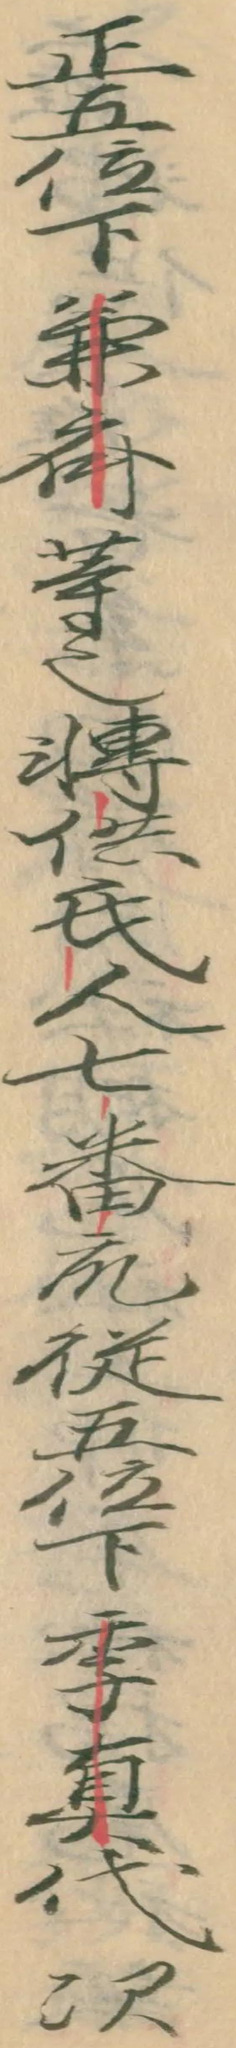正五位下兼斎等也転-供氏七-番-衆従五位下季真代次
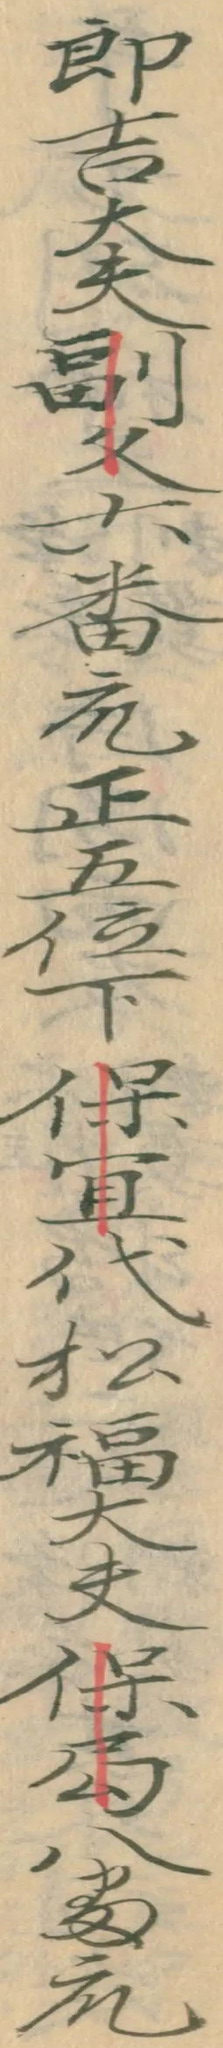郎吉大夫副久六番衆正五位下保宜代松福大夫保局八番衆
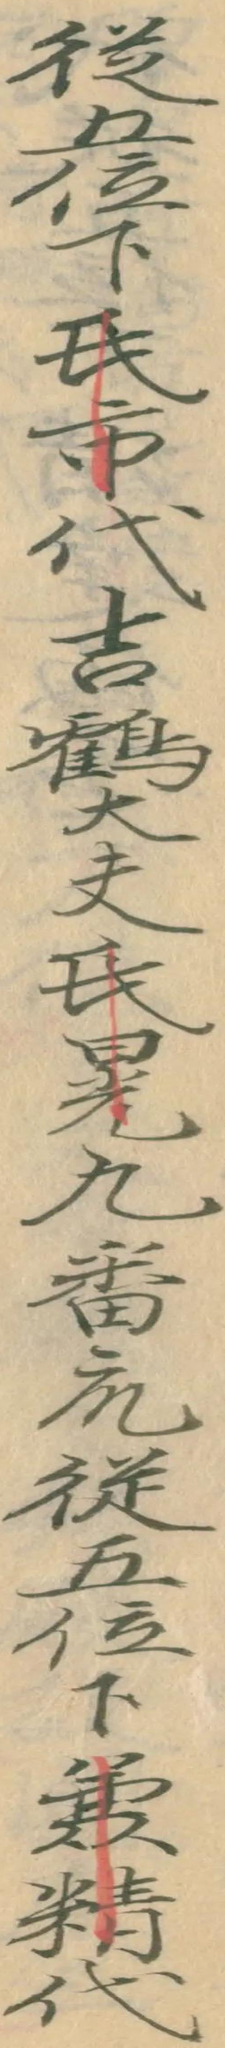従五位下氏市代吉鶴大夫氏晃九番衆従五位下兼精代
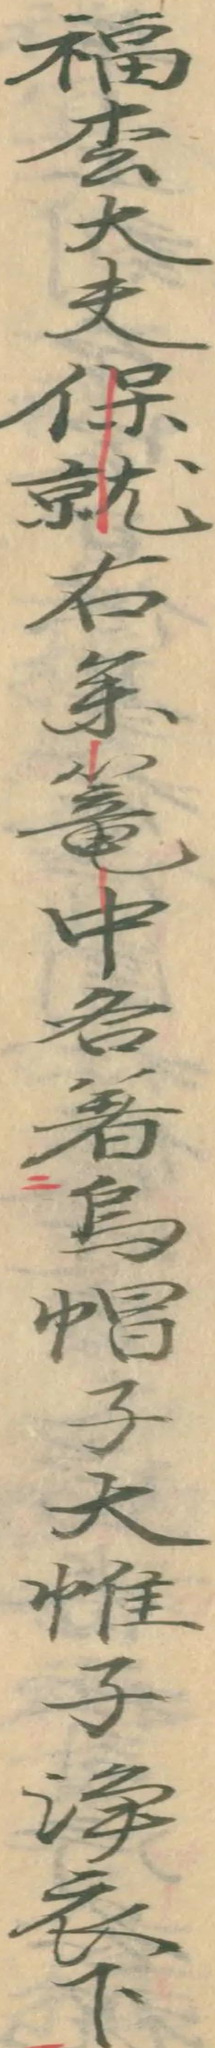福松大夫保就右参-篭-中各着烏帽子大帷子浄衣下

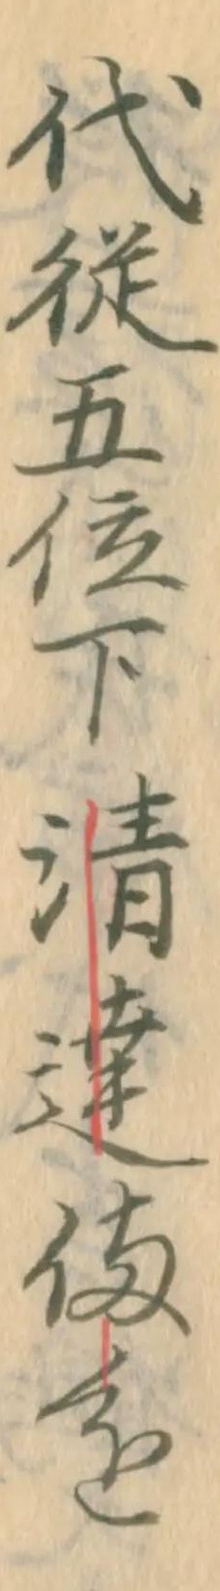代従五位下清達備-進
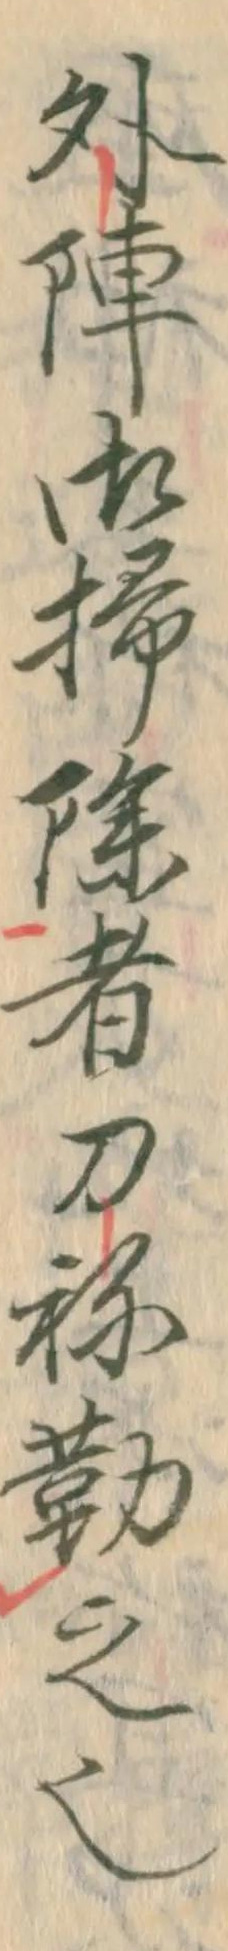外-陣御掃除者刀-祢勤之也

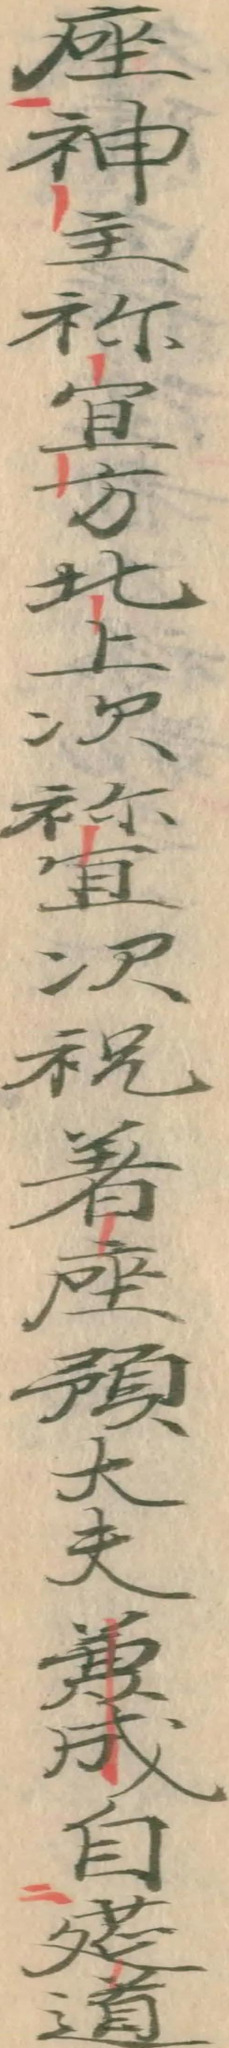座神_主祢-宜_方北-上次祢-宜次祝着-座預大夫兼成自筵-道

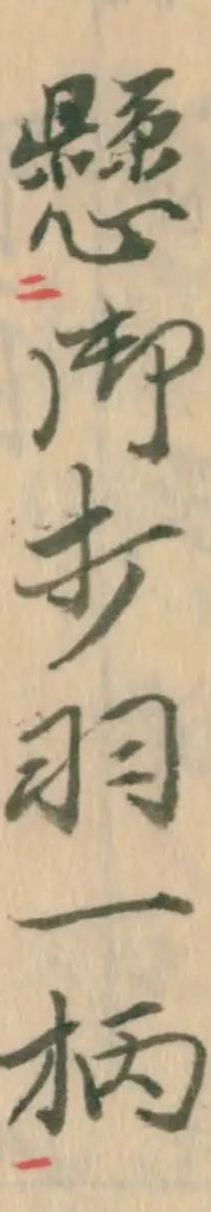懸御打羽一柄
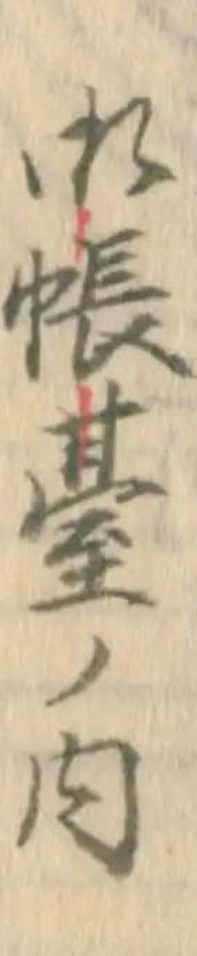御-帳-台ノ内

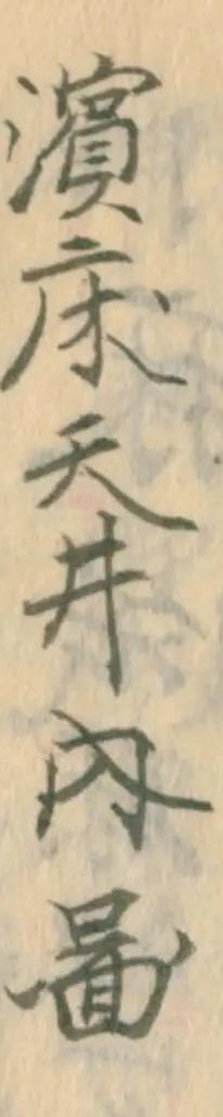内陣天井内図
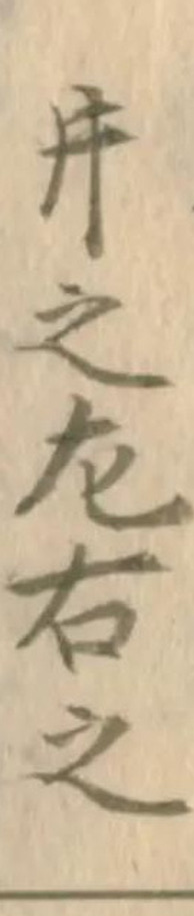井之左右之
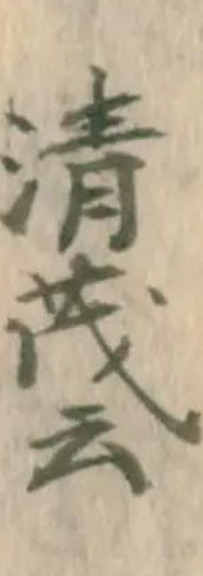青茂云
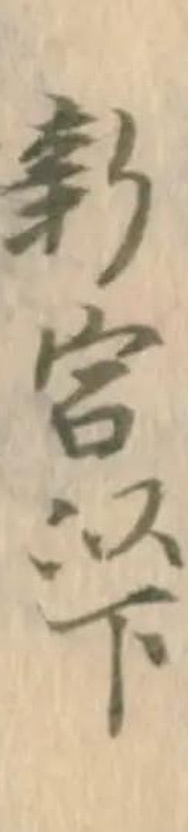新宮以下
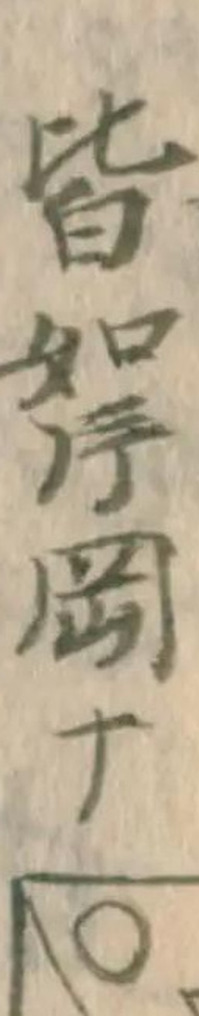皆如片岡ナ
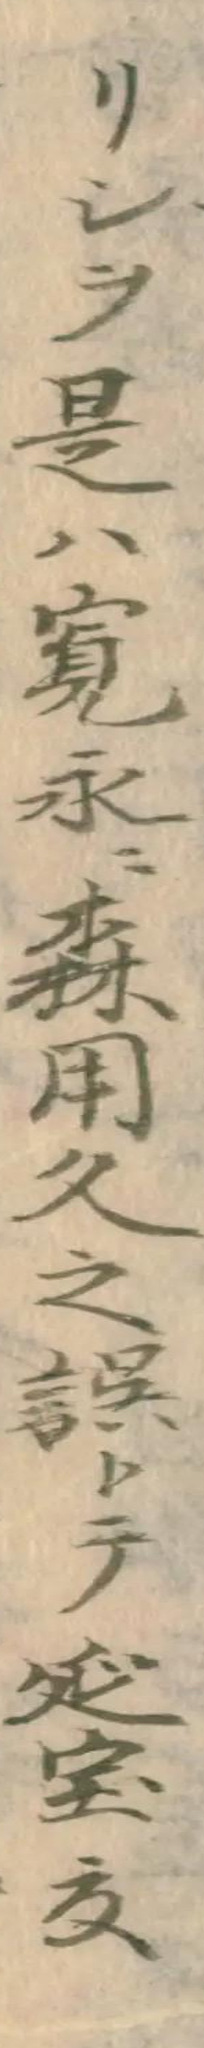リシヲ是ハ寛永ニ森用久之誤トテ延宝度
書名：賀茂社記録. 第16冊
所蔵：国立国会図書館 National Diet Library, JAPAN
